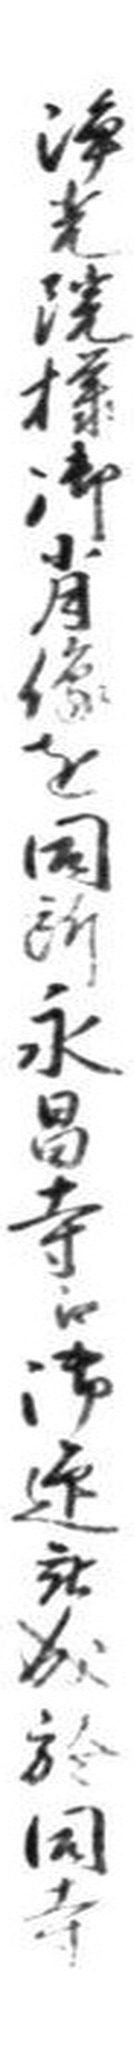浄光院様御肖像を同所永昌寺江御迎被成於同寺
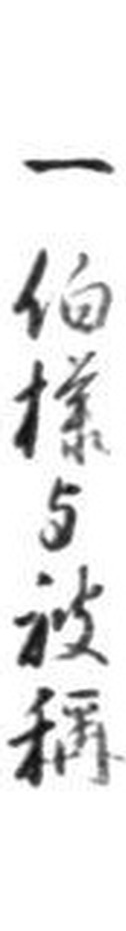一伯様与被称
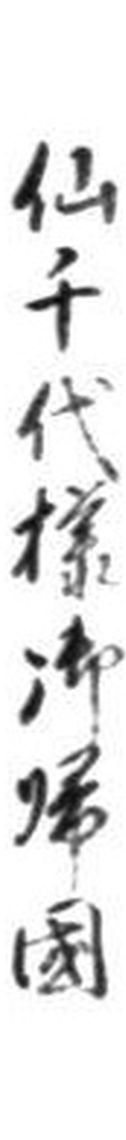仙千代様御帰国
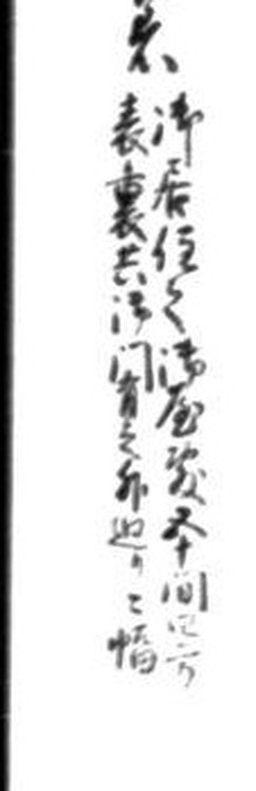表裏共御門有之外廻りニ幅
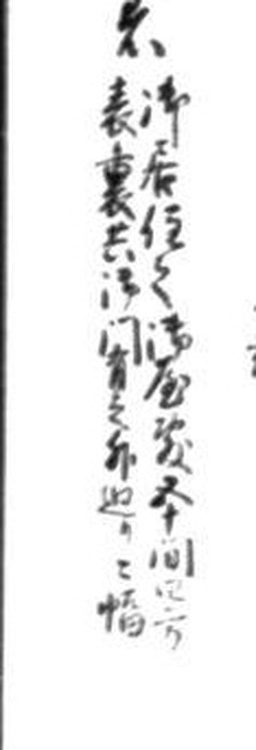表裏共御門有之外廻りニ幅
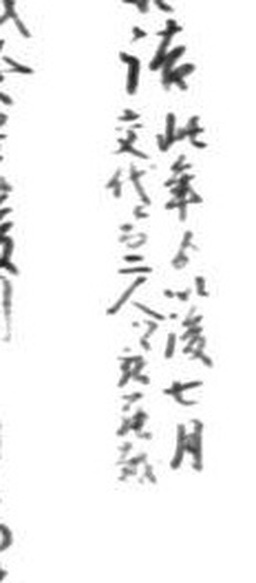交代ニ而二人ツヽ被罷越
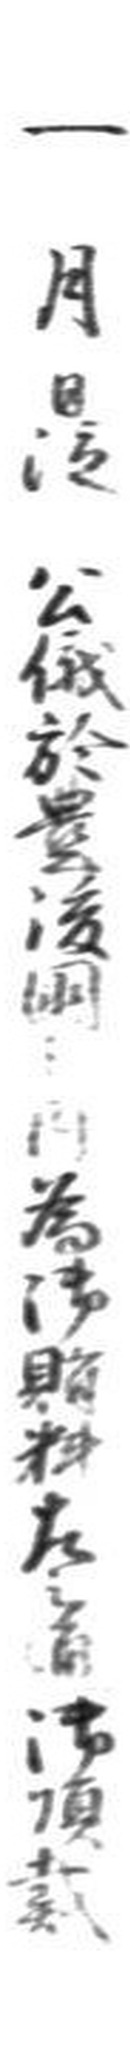一月日従公儀於豊後国之内為御賄料左之通御頂戴
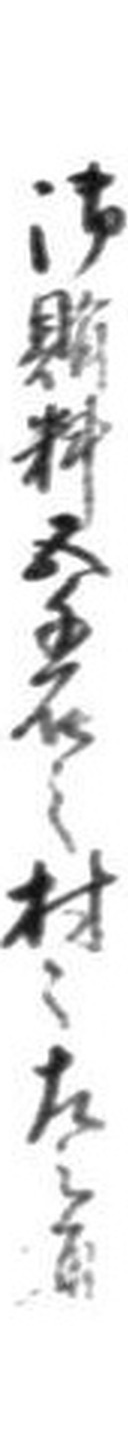御賄料五千石之村々左之通
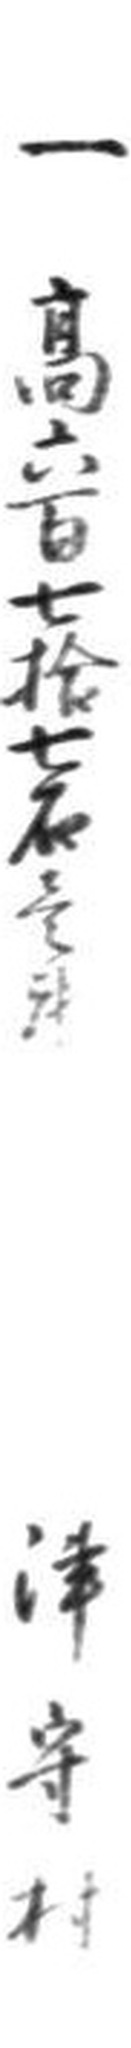一高六百七拾七石壱斗津守村
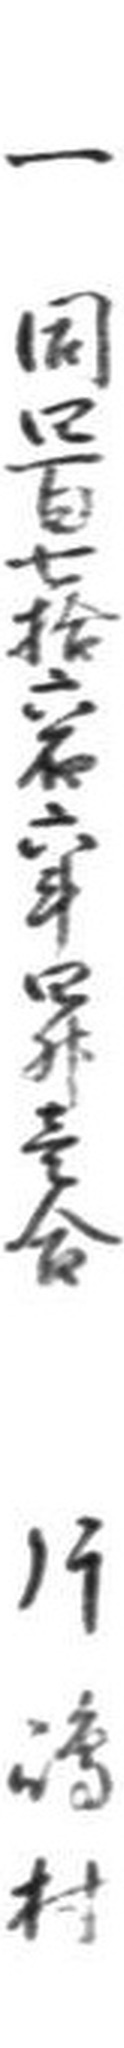一同四百七拾六石六斗四升壱合片嶋村
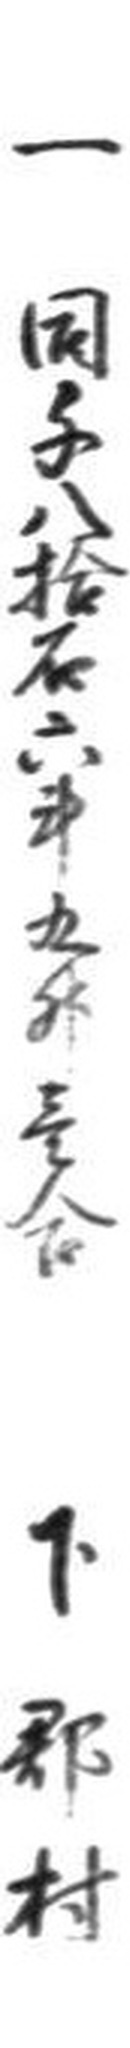一同千八拾石六斗九升壱合下郡村
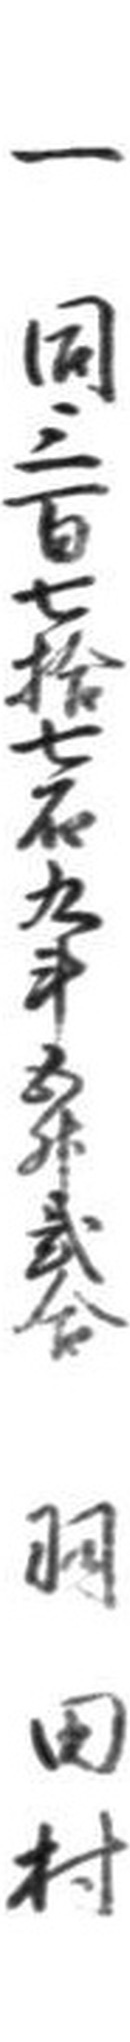一同三百七拾七石九斗五升弐合羽田村

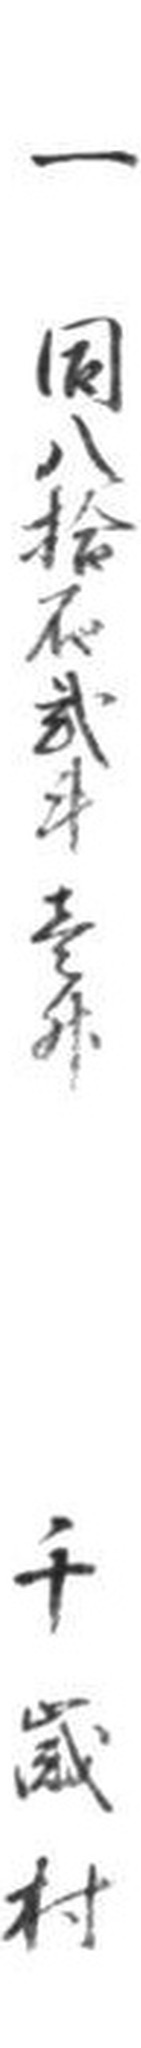一同八拾石弐斗壱升千歳村
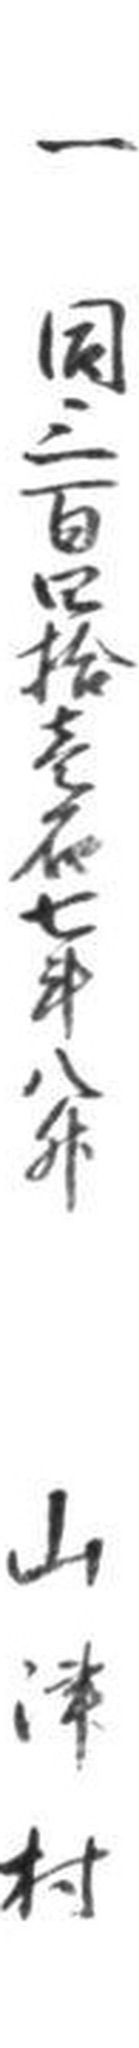一同三百四拾壱石七斗八升山津村
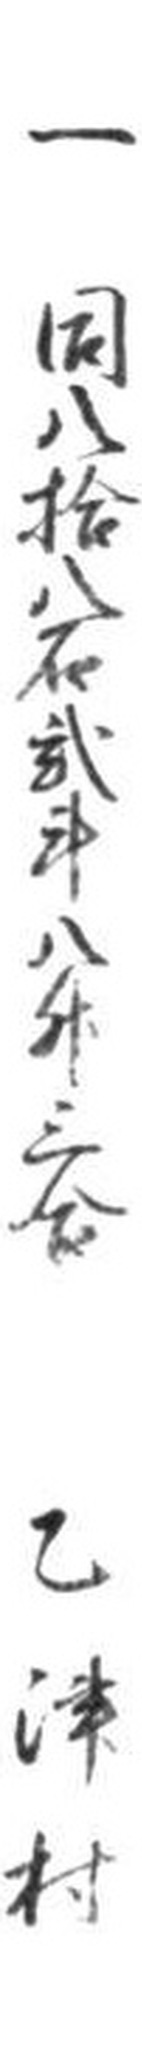一同八拾八石弐斗八升三合乙津村
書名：家譜 二 忠直公 従文禄四年到慶安四年
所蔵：福井県文書館 Fukui Prefectural Archives
